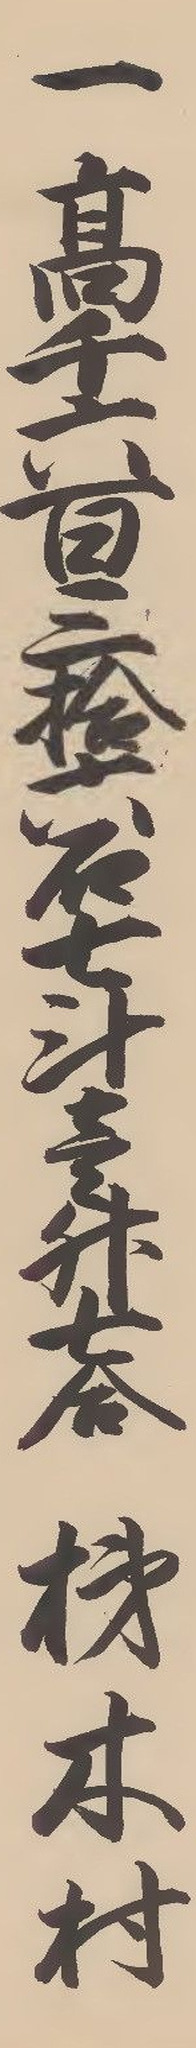一高千六百三拾六石七斗壱升七合柿木村

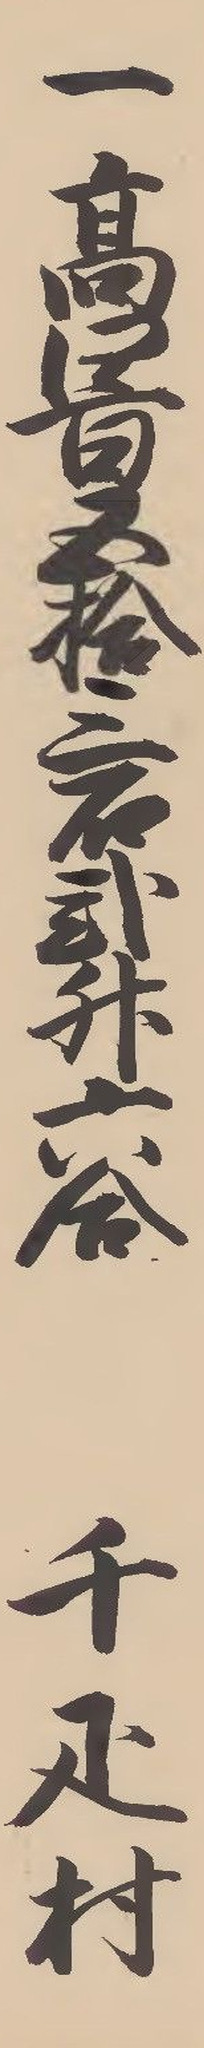一高四百五拾三石弐升六合千疋村
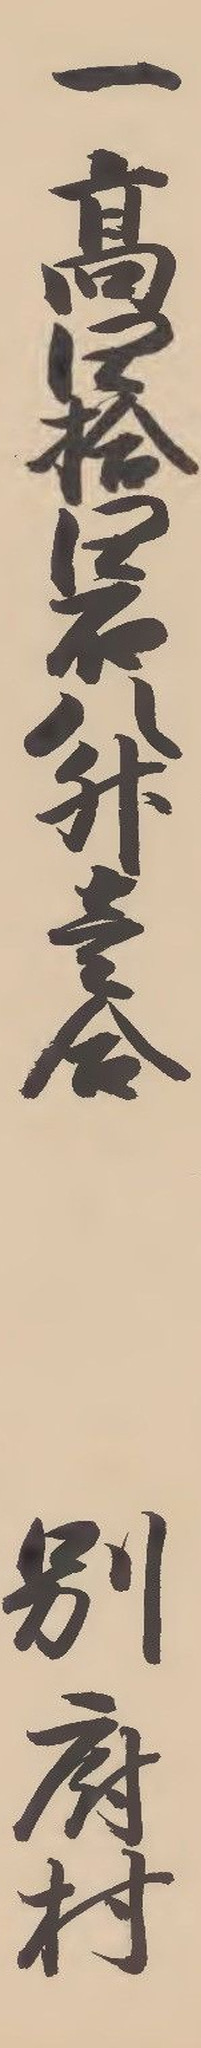一高四拾四石八升壱合別府村
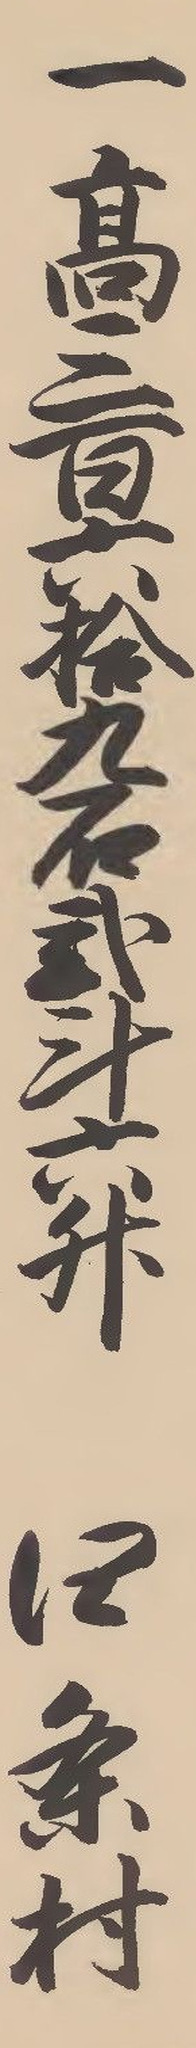一高三百六拾九石弐斗六升四条村
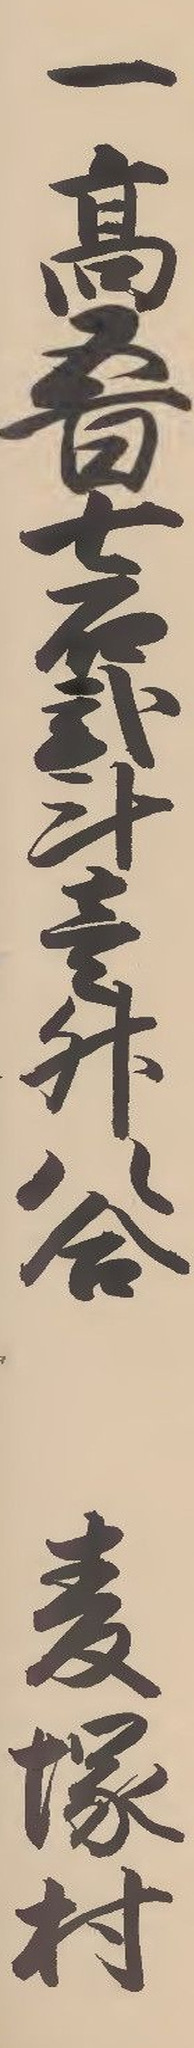一高五百七石弐斗壱升八合麦塚村
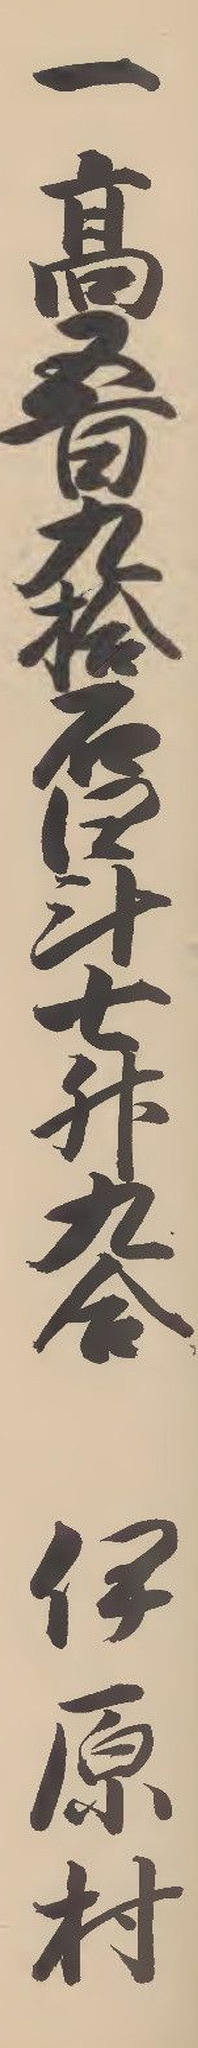一高五百九拾石四斗七升九合伊原村
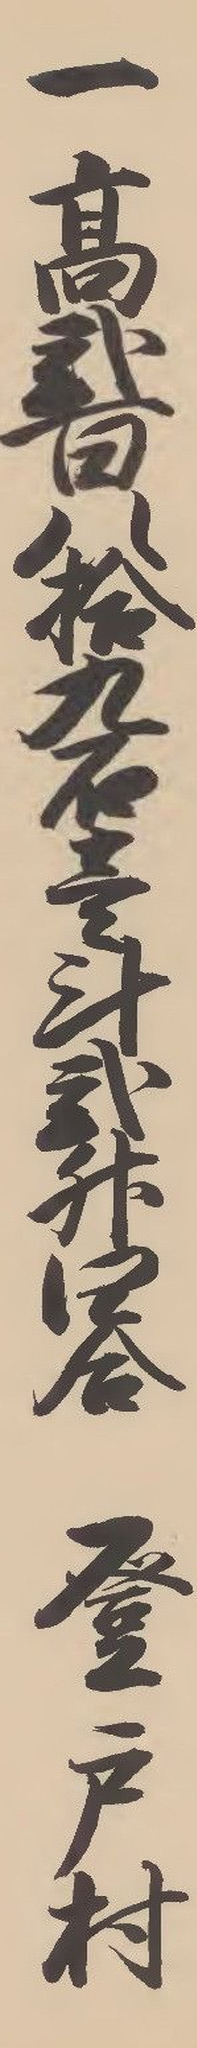一高弐百八拾九石壱斗弐升四合登戸村
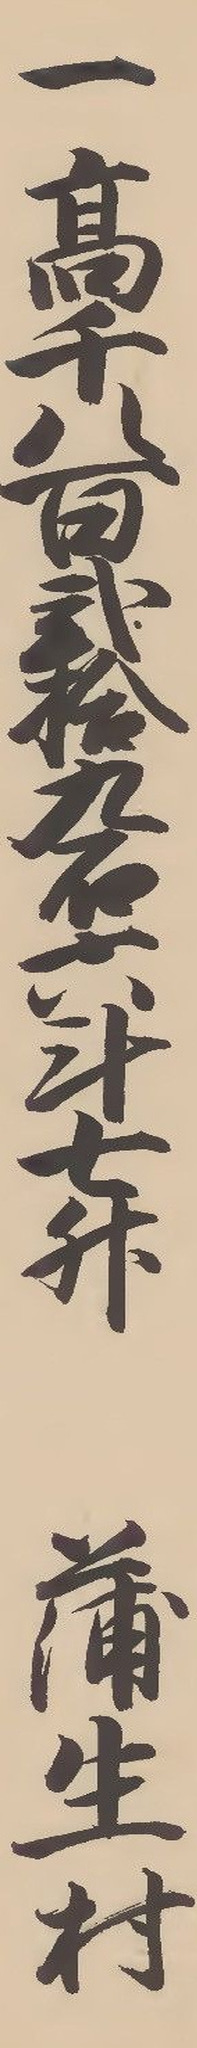一高千八百弐拾八石六斗七升蒲生村
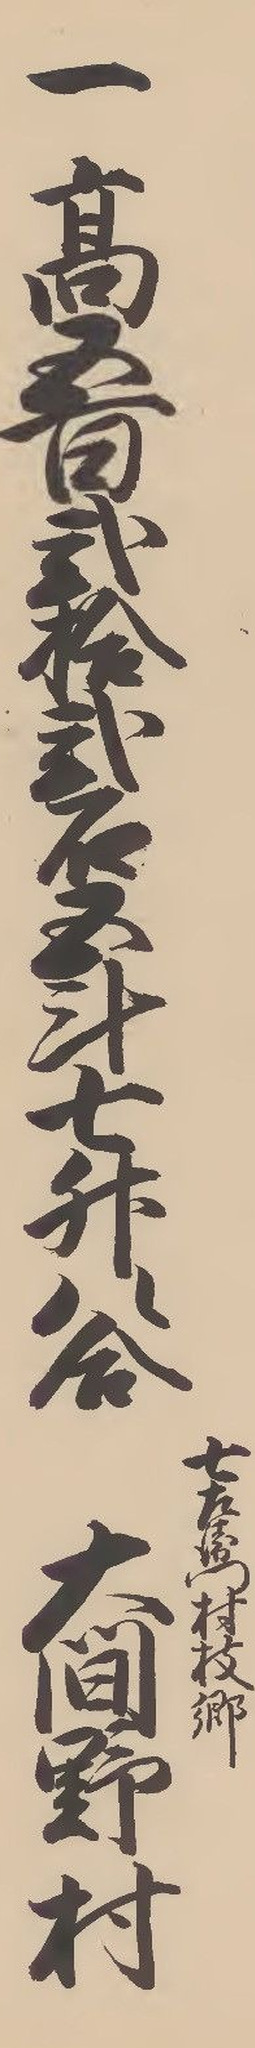一高五百弐拾弐石五斗七升八合大間野村

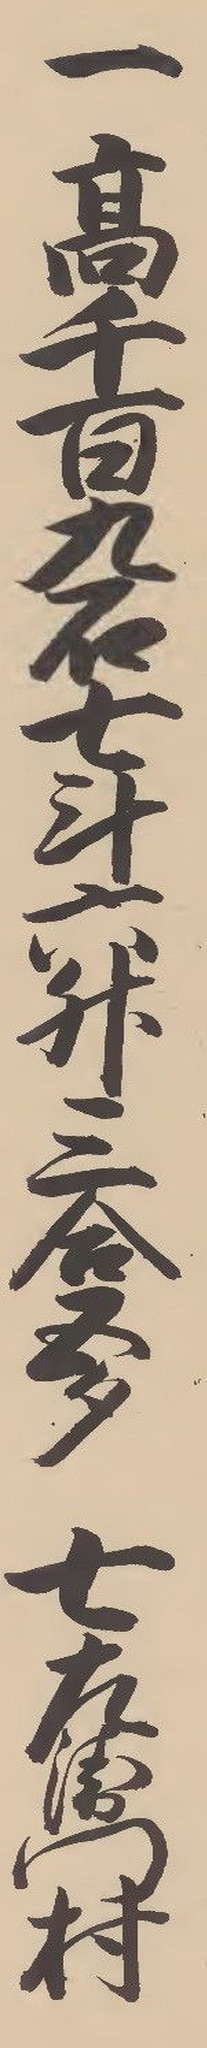一高千百九石七斗六升三合五勺七左衛門村
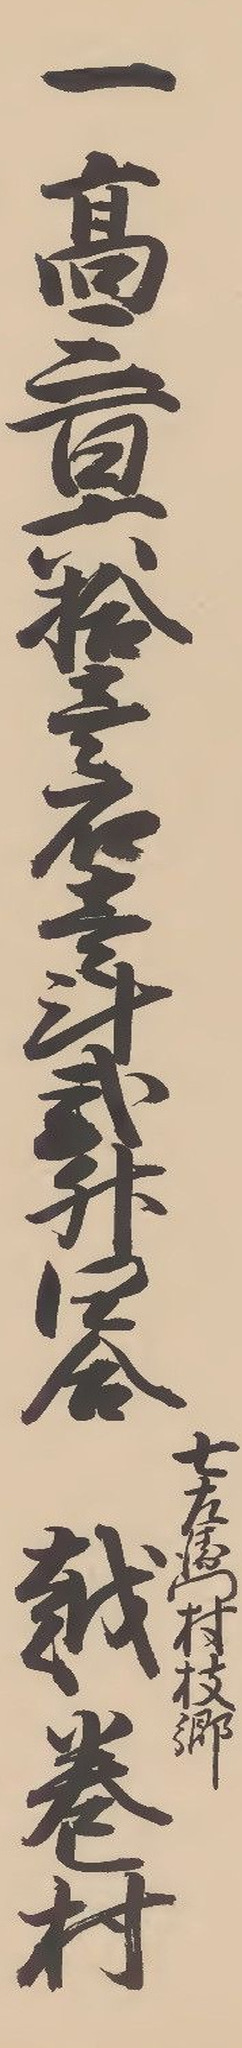一高三百六拾壱石壱斗弐升四合越巻村
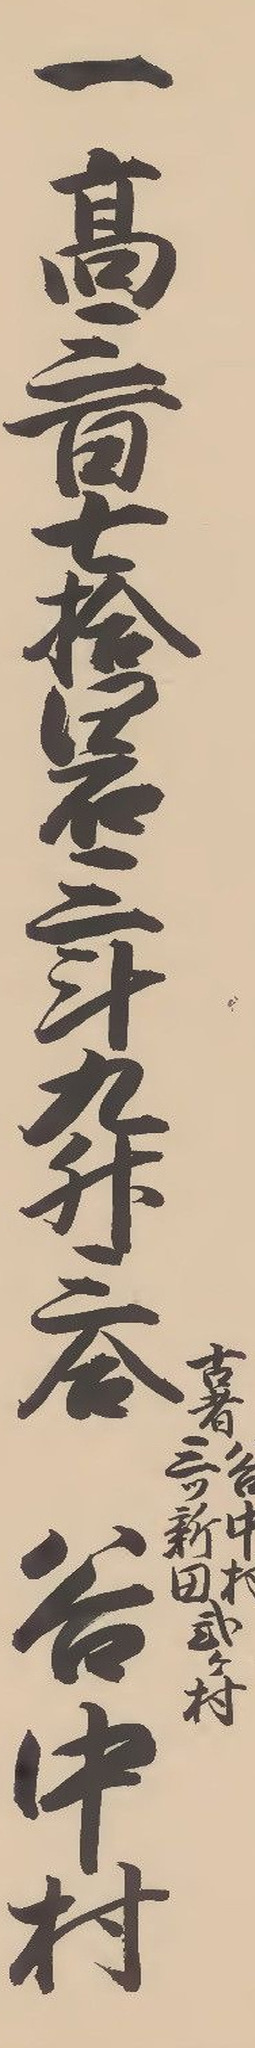一高三百七拾四石三斗九升三合谷中村
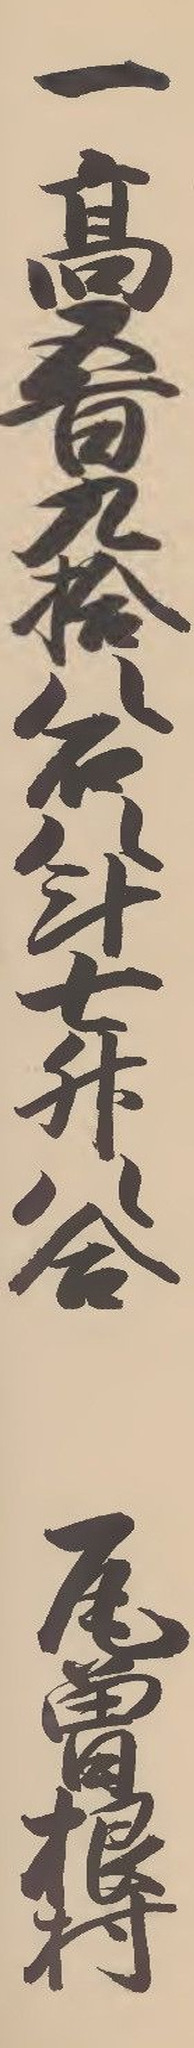一高五百九拾八石八斗七升八合瓦曽根村
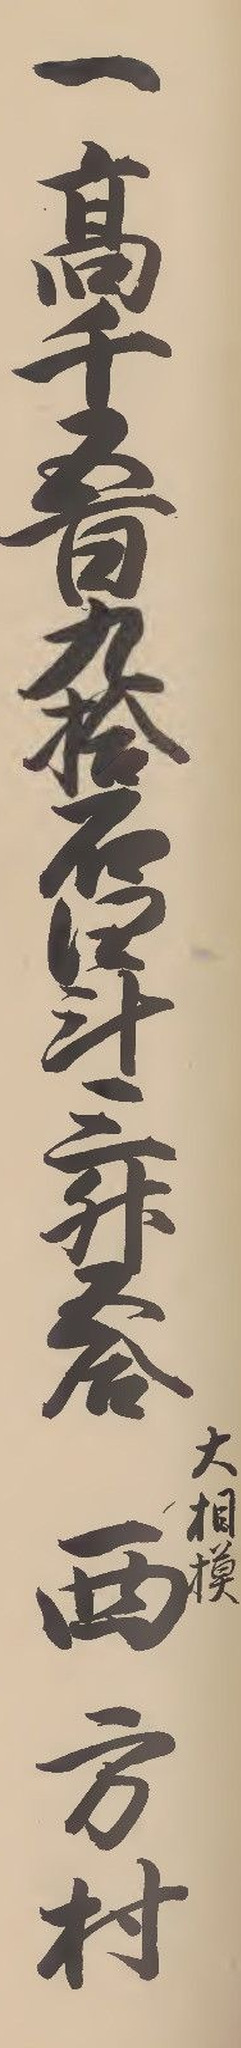一高千五百九拾石四斗三升五合西方村
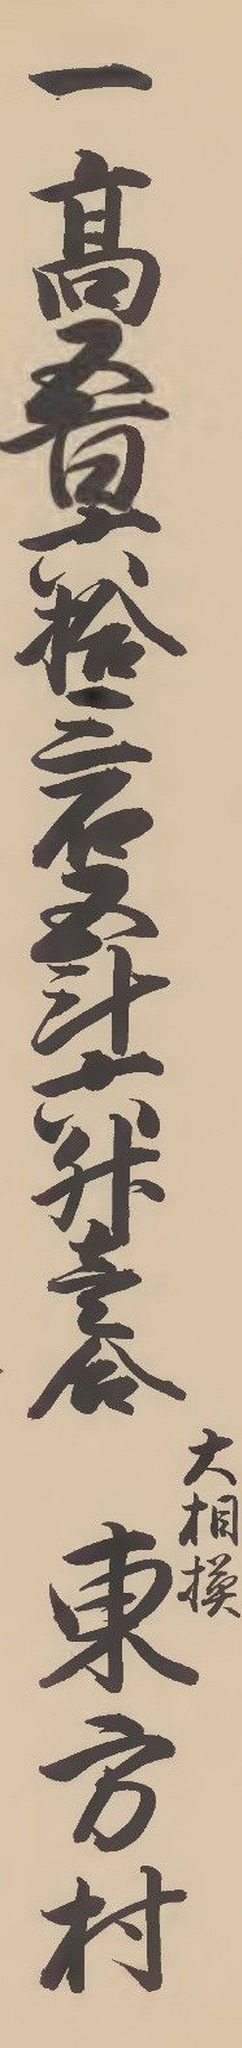一高五百六拾三石五斗六升壱合東方村
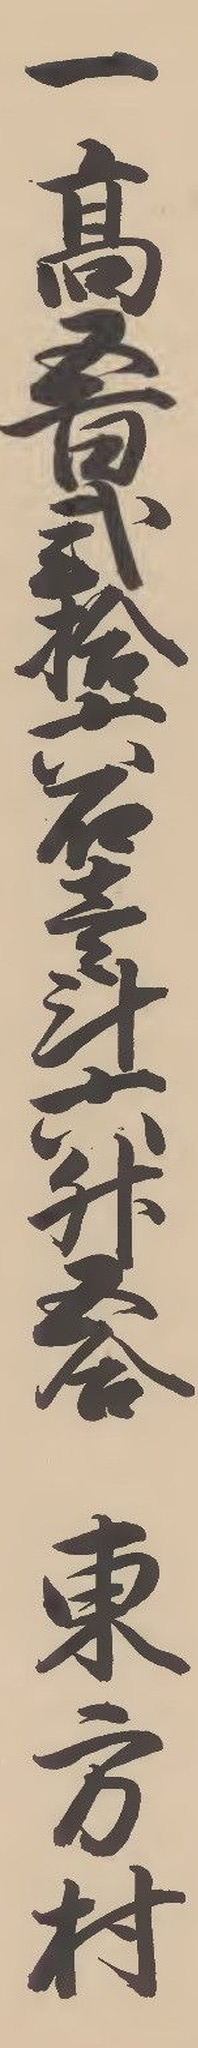一高五百弐拾六石壱斗六升五合東方村
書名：武蔵国郷帳　下
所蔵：国立公文書館 National Archives of Japan
